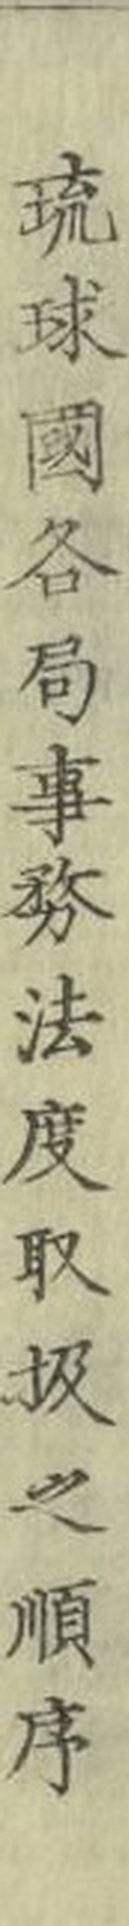琉球國各局事務法度取扱之順序
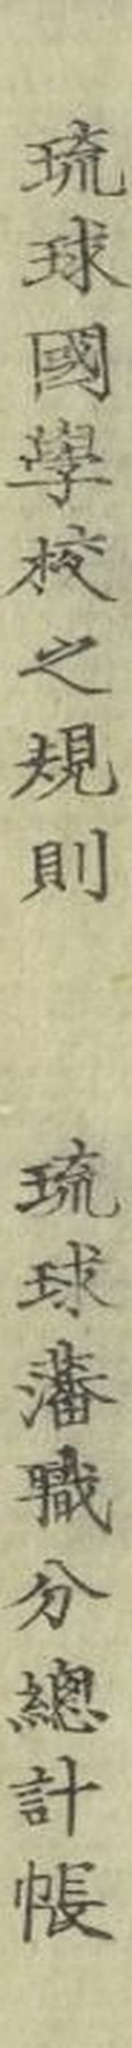琉球國學校之規則琉球藩職分總計帳
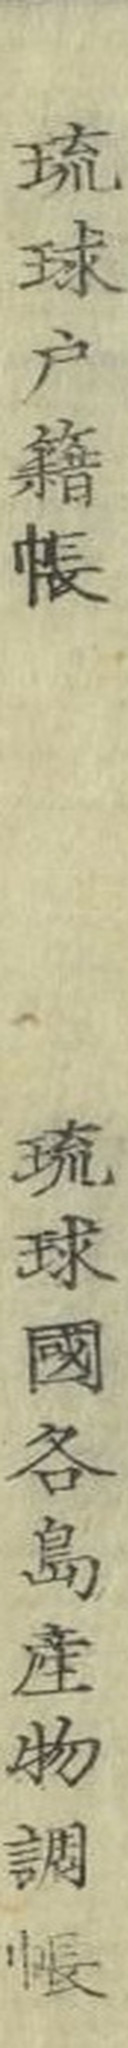琉球户籍帳琉球國各島產物調帳
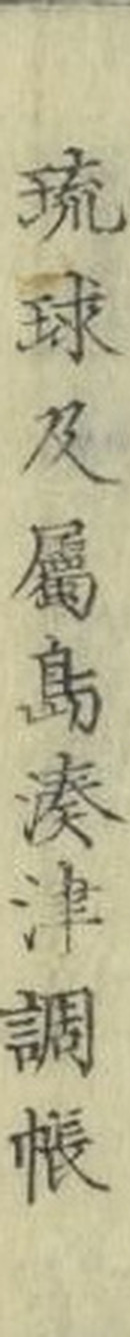琉球及屬島湊津調帳
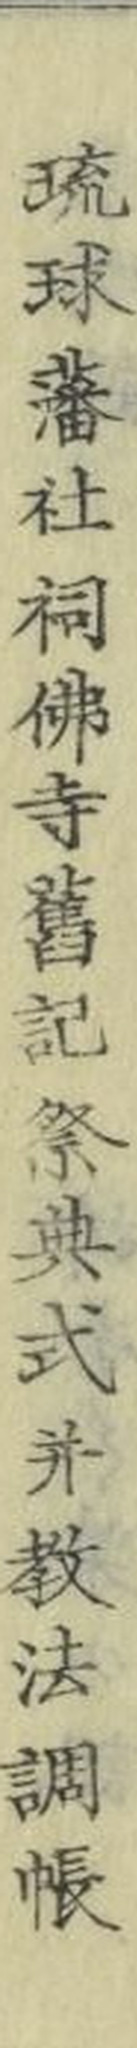琉球藩社祠佛寺舊記祭典式并教法調帳
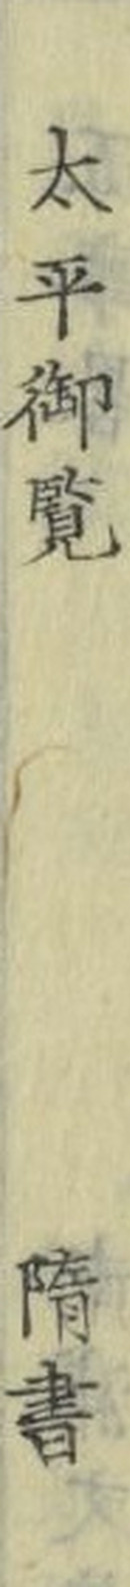太平御覽隋書
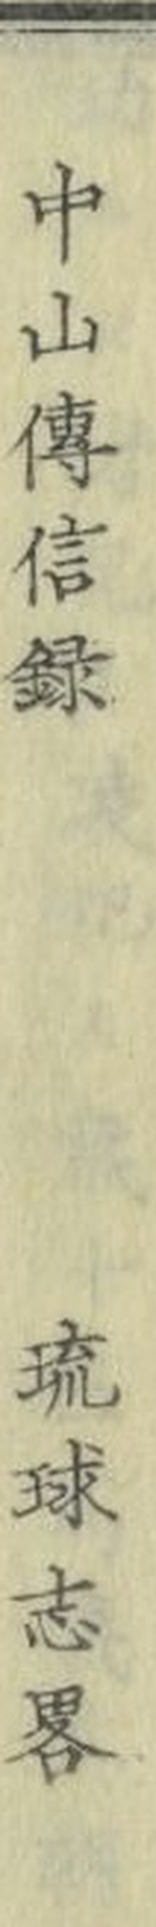中山傳信錄琉球志畧
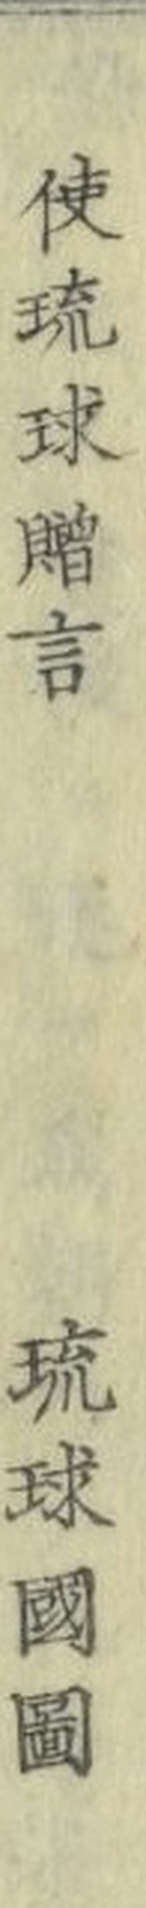使琉球贈言琉球國圖

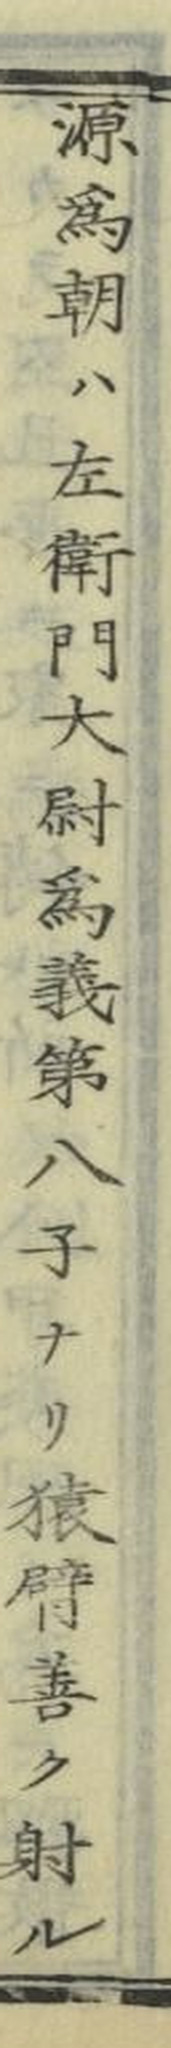源爲朝ハ左衛門大尉爲義第八子ナリ猿臂善ク射ル
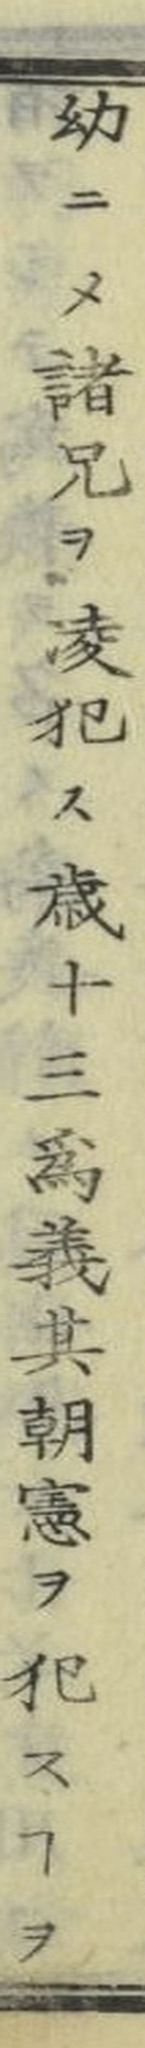幼ニ乄諸兄ヲ凌犯ス歳十三爲義其朝憲ヲ犯スコトヲ
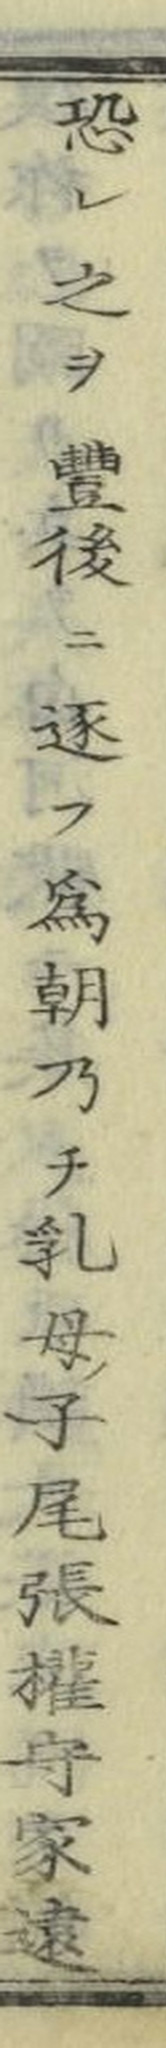恐レ之ヲ豐後ニ逐フ爲朝乃チ乳母子尾張權守家遠
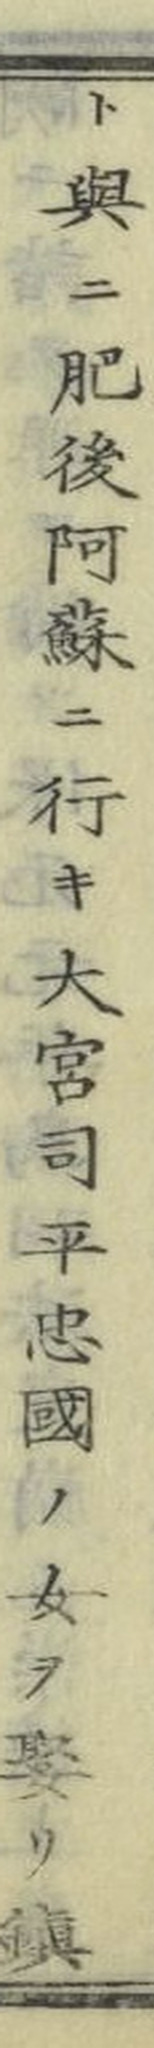ト與ニ肥後阿蘇ニ行キ大宮司平忠國ノ女ヲ娶リ鎭
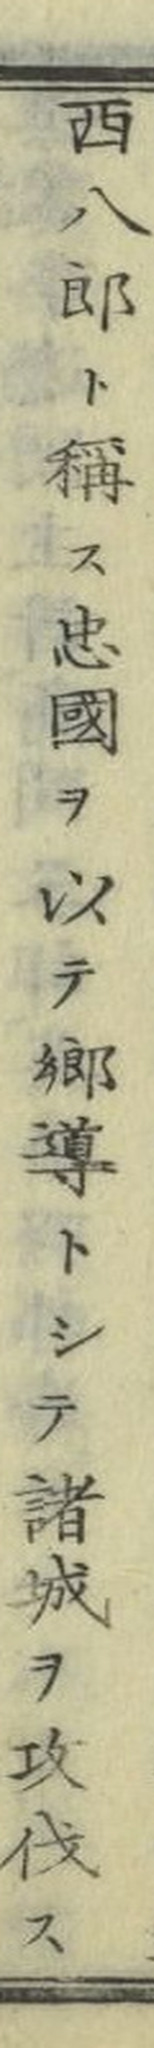西八郎ト稱ス忠國ヲ以テ鄉導トシテ諸城ヲ攻伐ス
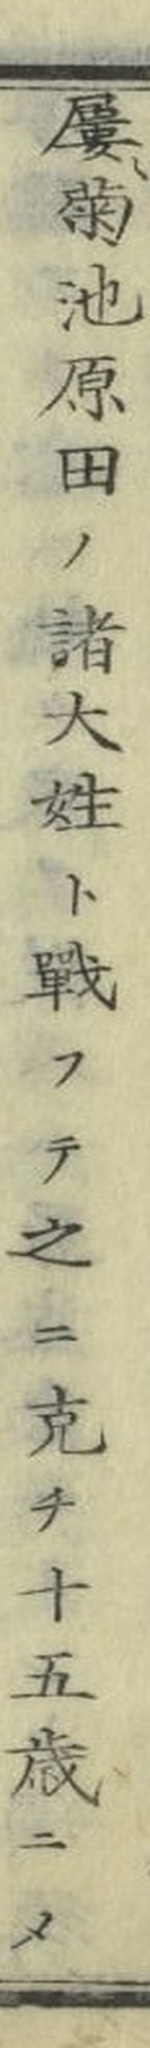屢〻菊池原田ノ諸大姓ト戰フテ之ニ克チ十五歳ニ乄
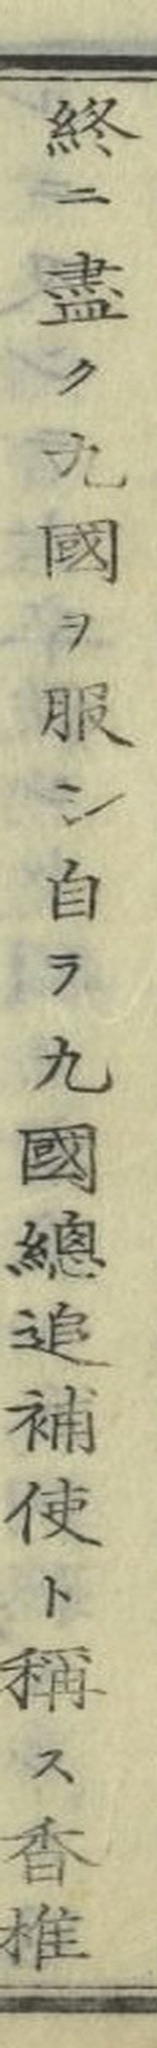終ニ盡ク九國ヲ服シ自ヲ九國總追補使ト稱ス香推
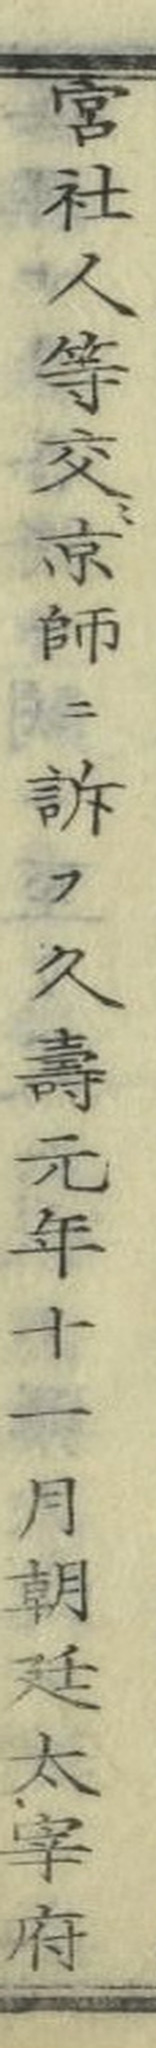宫社人等交〻京師ニ訴フ久壽元年十一月朝廷太宰府
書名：琉球藩史 一之巻
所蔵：University of the Ryukyus Library
